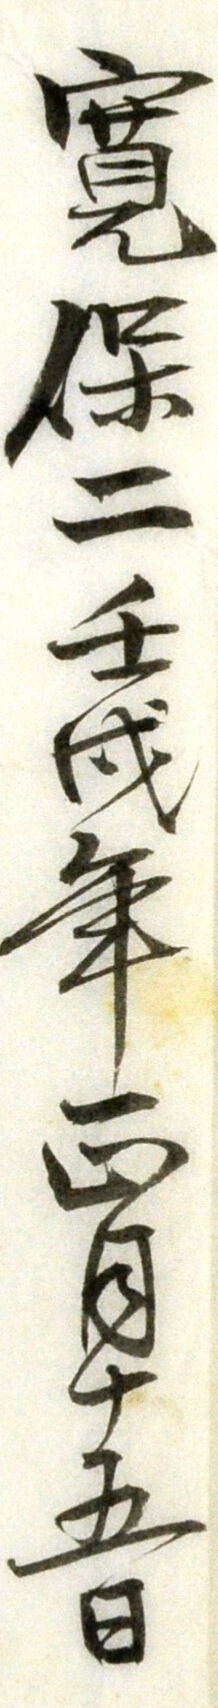寛保二壬戌年正月十五日
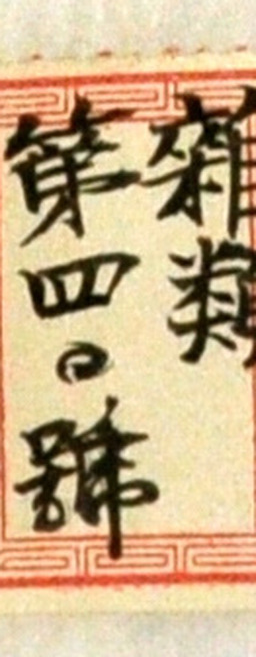第四〇号

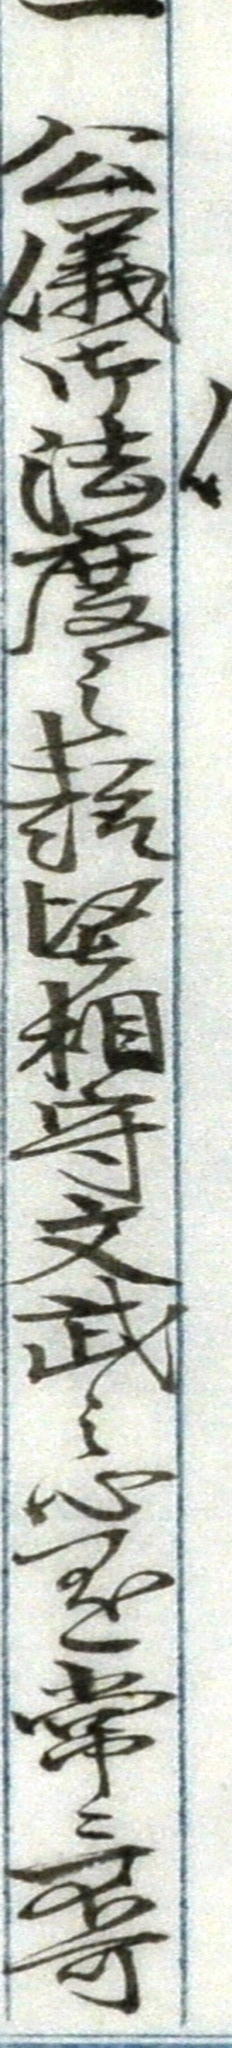一公儀御法度之趣堅相守文武之心懸常に不可
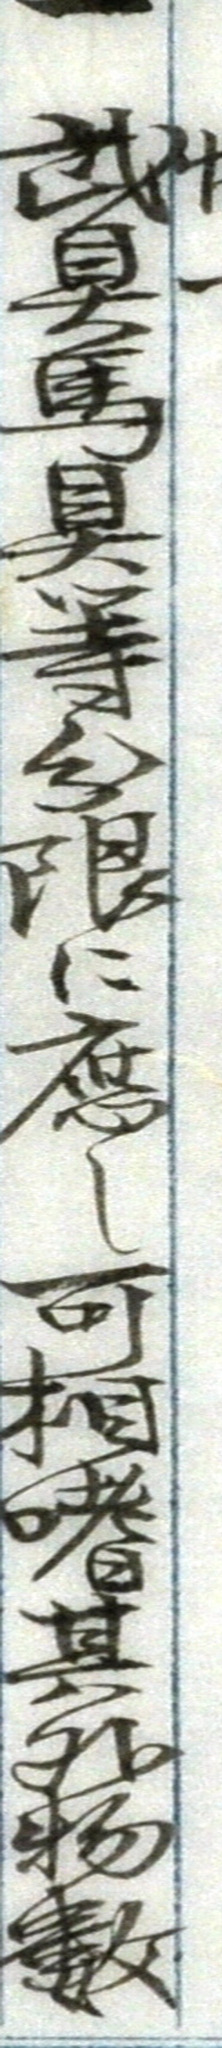一武具馬具等分限に応し可相嗜其外物数
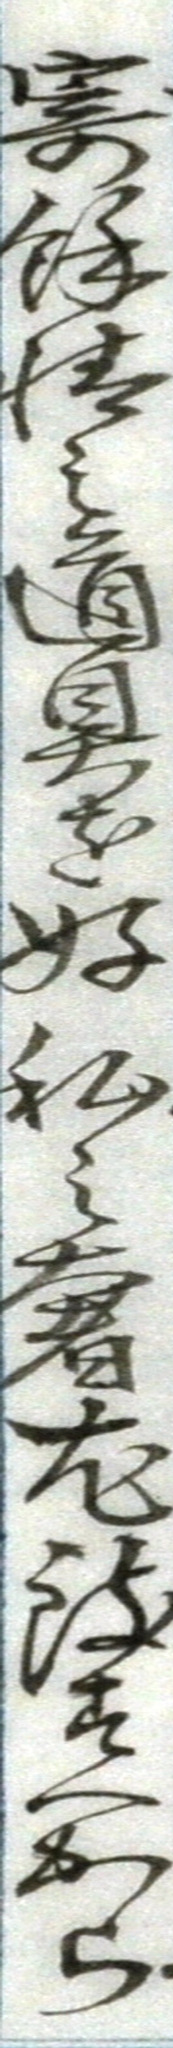寄余情之道具を好私之奢尤致すへから
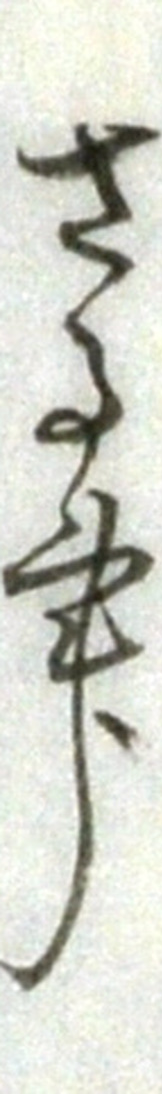さる事
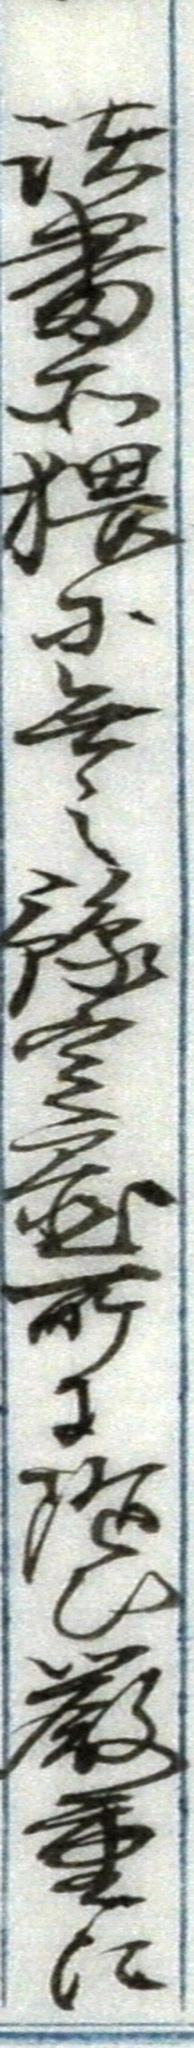一諸番所猥に無之予定置所に随ひ厳重に
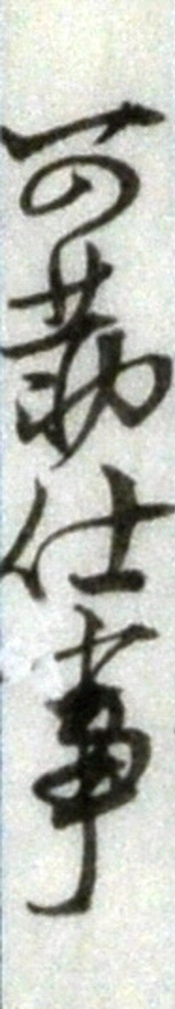可勤仕事
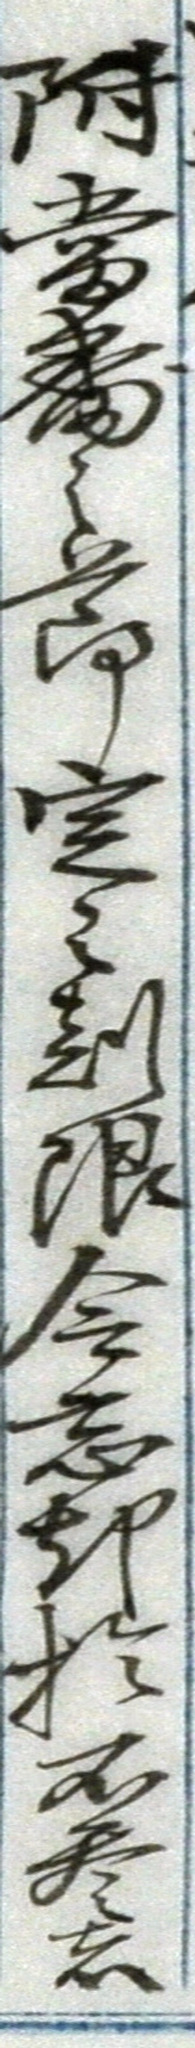附当番之節定之刻限令忘却於不参者
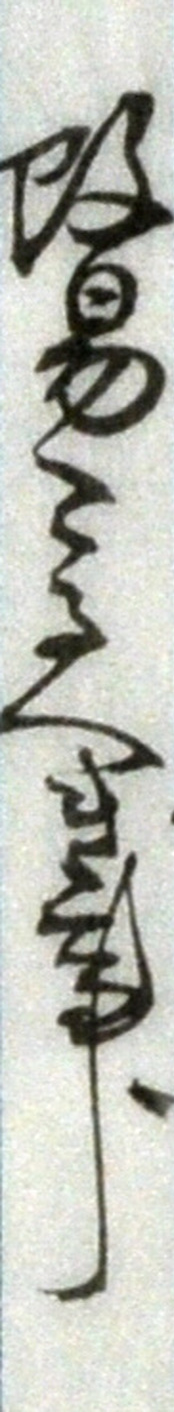改易たるへき事、
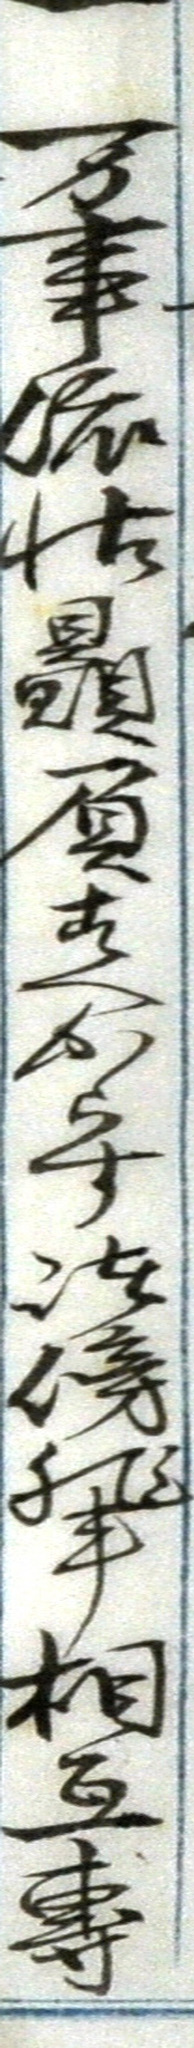一万事依怙贔屓すへからす諸傍輩相互専
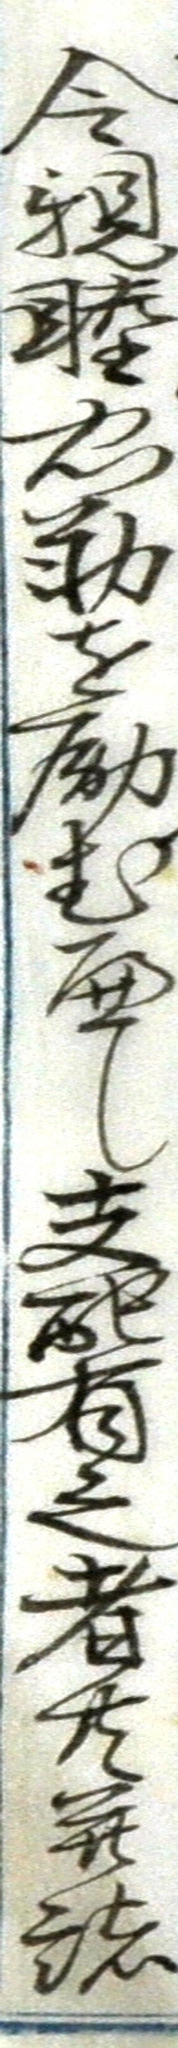令親睦忠勤を励むへし支配有之者共并諸

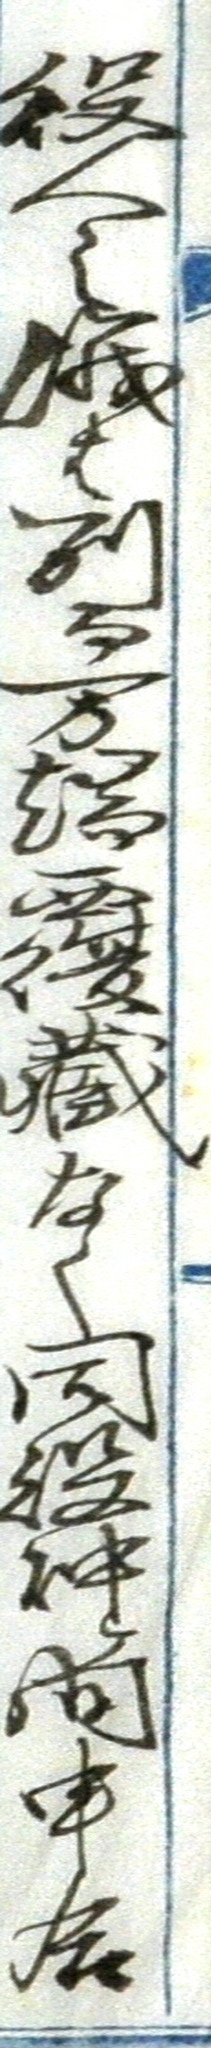役人之儀者別而万端覆蔵なく同役仲間申合
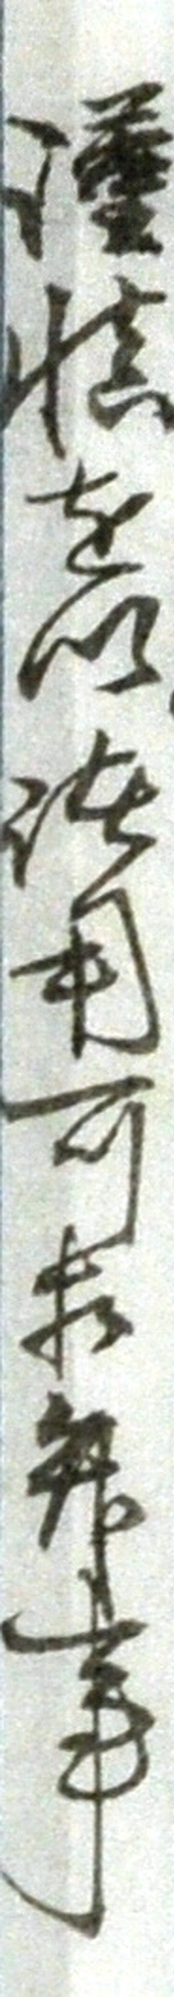謹慎を以諸用可相弁事
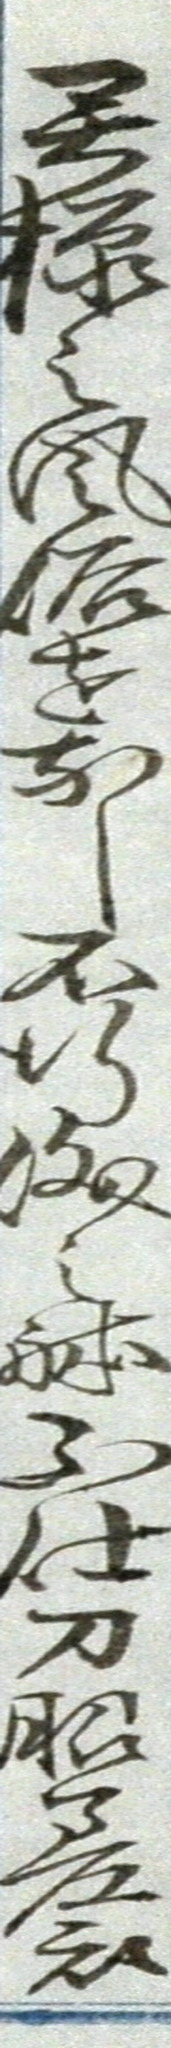一異様之風俗をなし不行儀之体不仕刀脇差衣
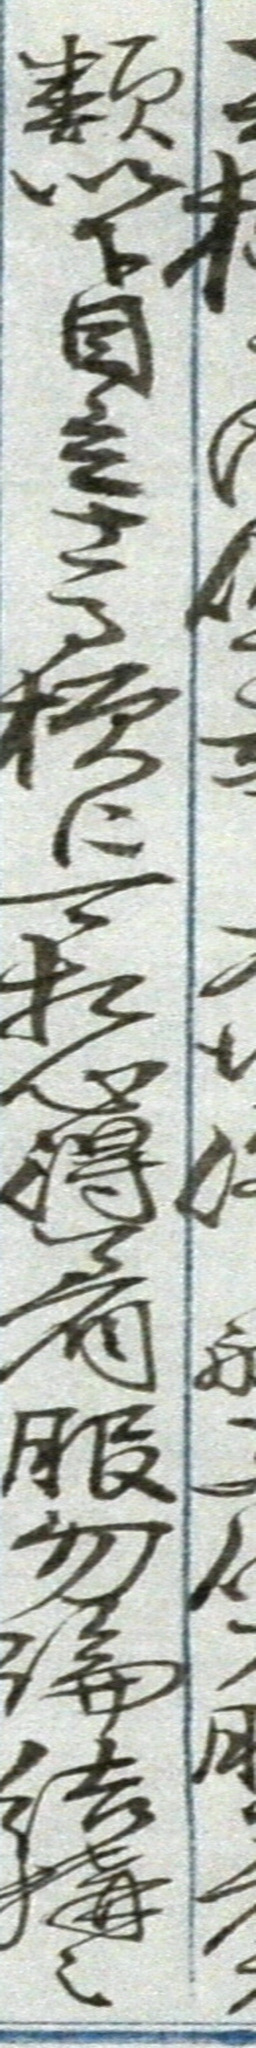類以下目立さる様に可相心得着服勿論結構之
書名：頼由公御定之条々
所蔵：伊那市立高遠町図書館・合同会社AMANE
